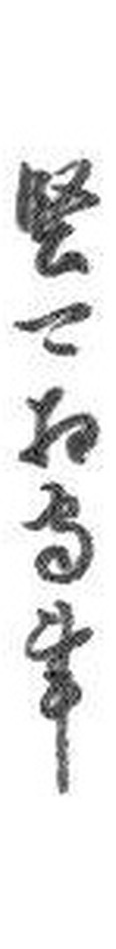堅可相守事
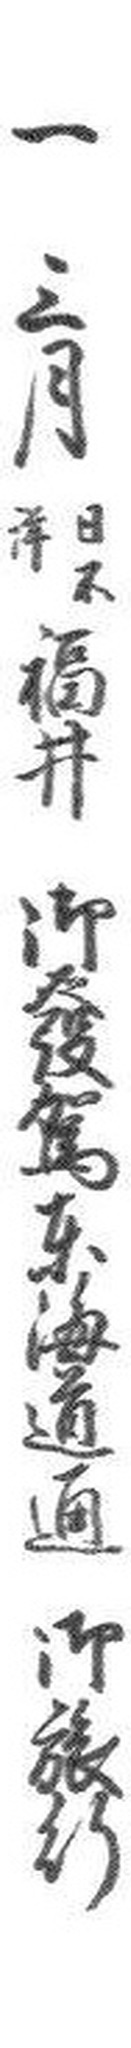一三月日不詳福井御発駕東海道通御旅行
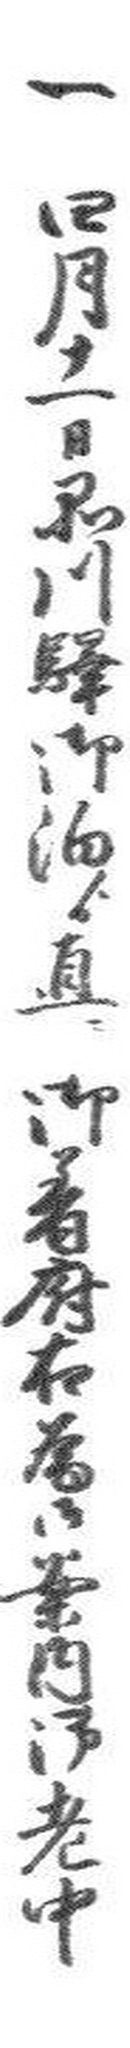一四月十一日品川駅御泊ゟ直ニ御着府右為御案内御老中
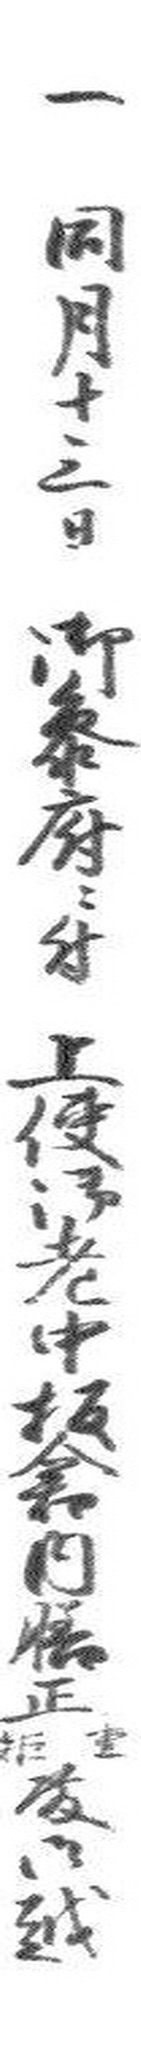一同月十三日御参府ニ付上使御老中板倉内膳正重矩殿御越
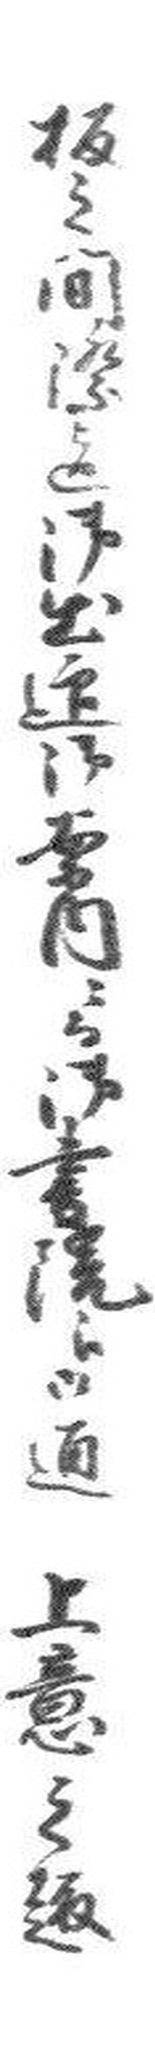板之間際迄御出迎御案内ニ而御書院江御通上意之趣
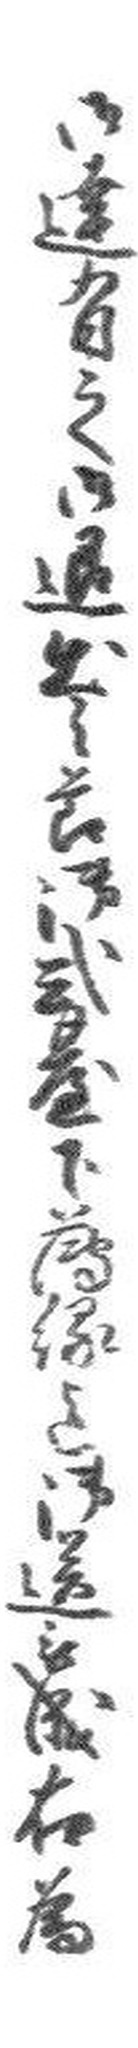御達有之御退出之節御式台下薄縁迄御送被成右為
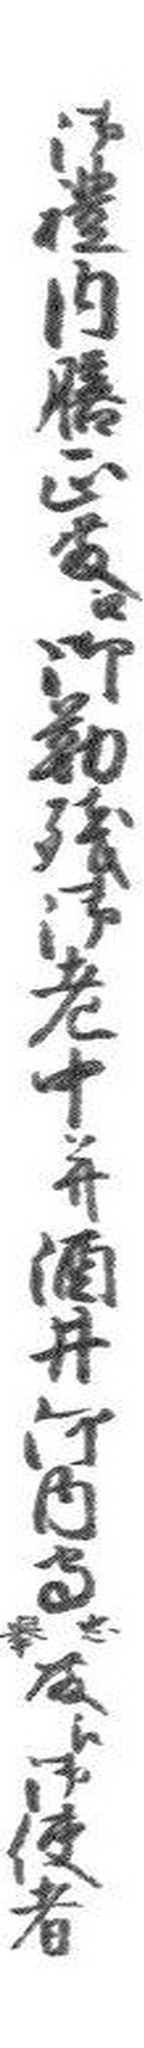御礼内膳正殿江御勤残御老中并酒井河内守忠挙殿江御使者
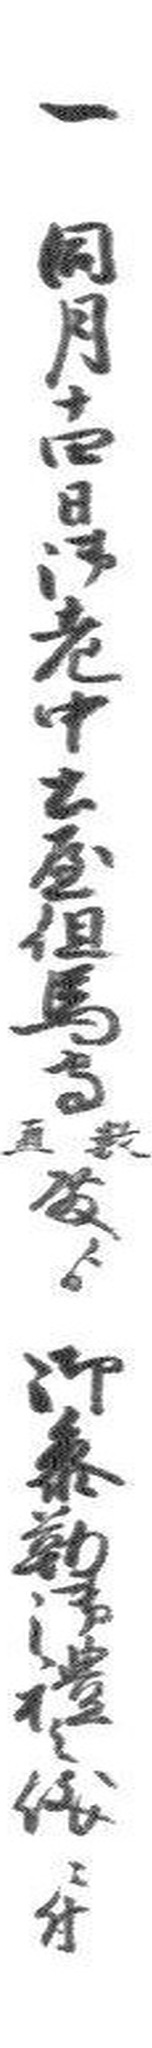一同月十四日御老中土屋但馬守数直殿ゟ御参勤御礼之儀ニ付

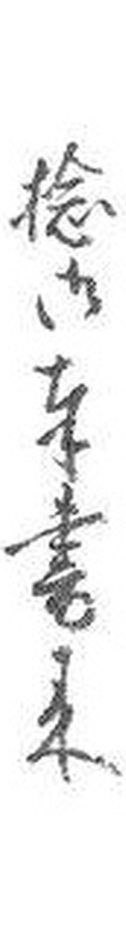捻御奉書来
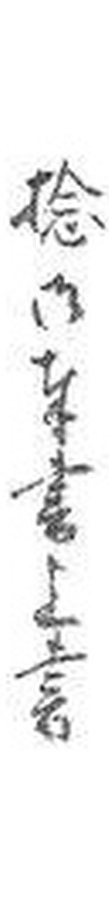捻御奉書上書
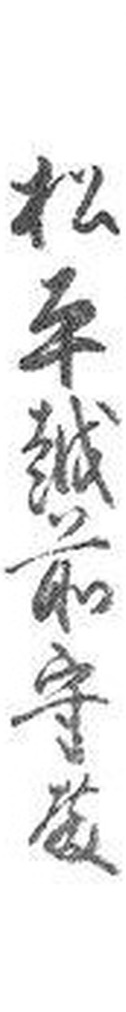松平越前守殿
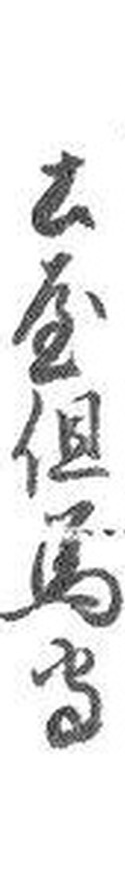土屋但馬守
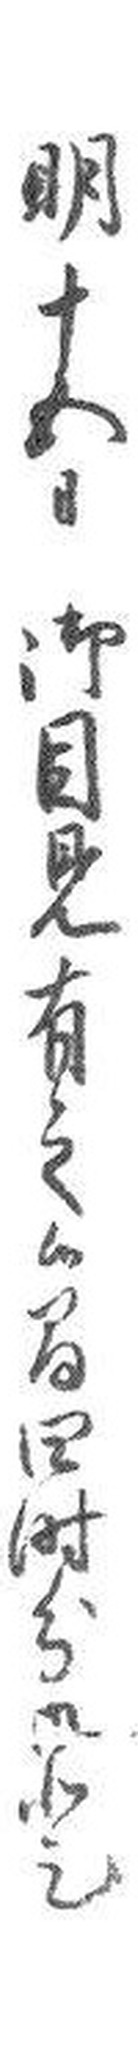明十五日御目見有之候間四時分御登
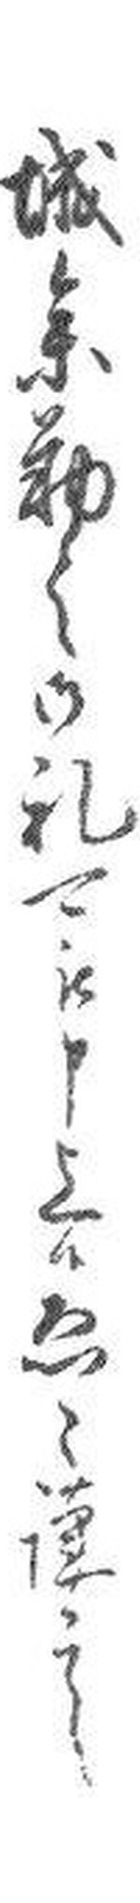城参勤之御礼可被申上候恐々謹言
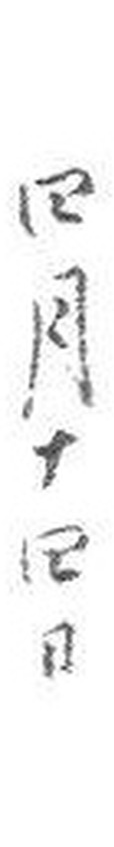四月十四日
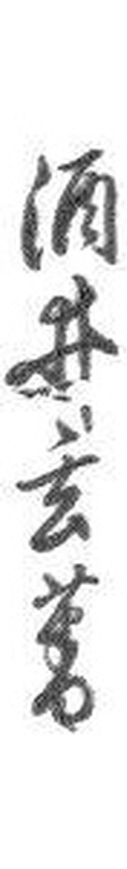酒井玄蕃
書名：家譜 七 光通公 従寛文四年到同九年
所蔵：福井県文書館 Fukui Prefectural Archives
